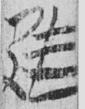○（誰）
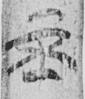不
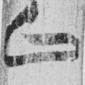㠯（以）
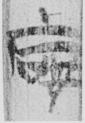厚
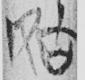姑（苦）
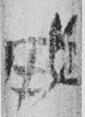○（成）
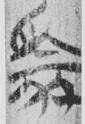○（家）
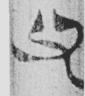父
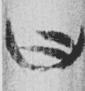曰
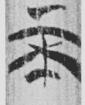不
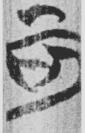可
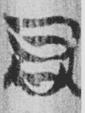君
